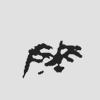陵
